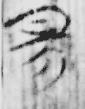昜（陽）
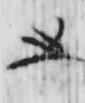之
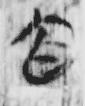官
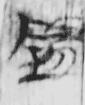○（陽）
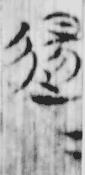逿逿
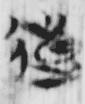逃
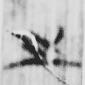之
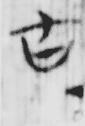古（故）
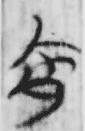宵
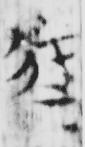逆
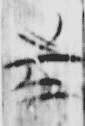往
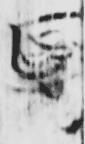慪
